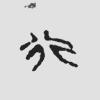行
